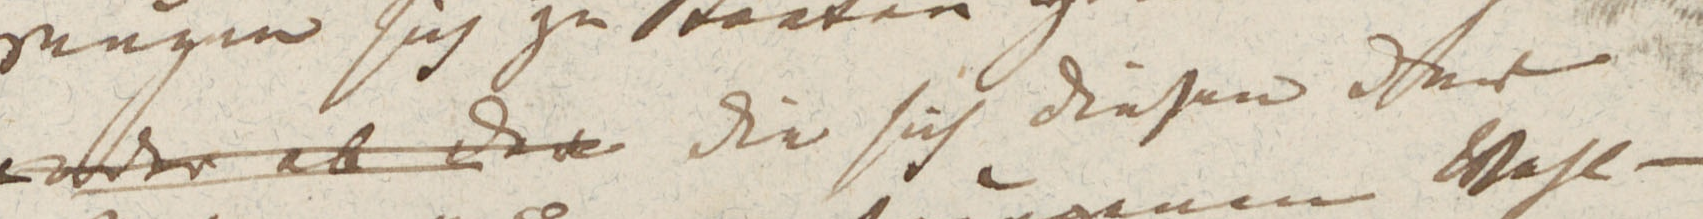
oder ob der die sich diesen der
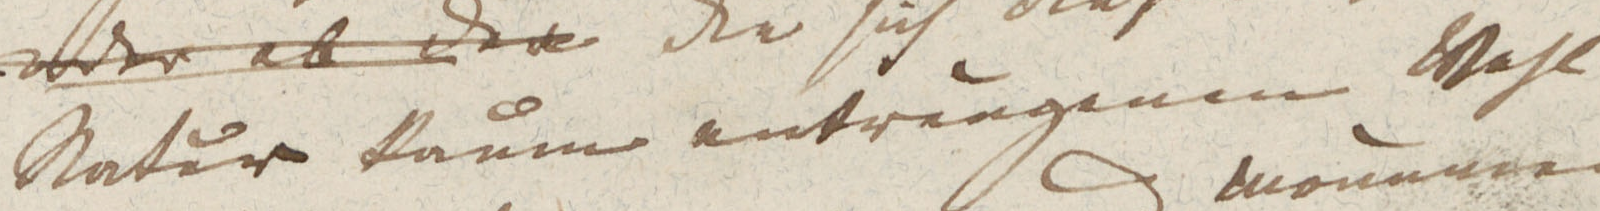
Natur kaum entrungenen Wahl-
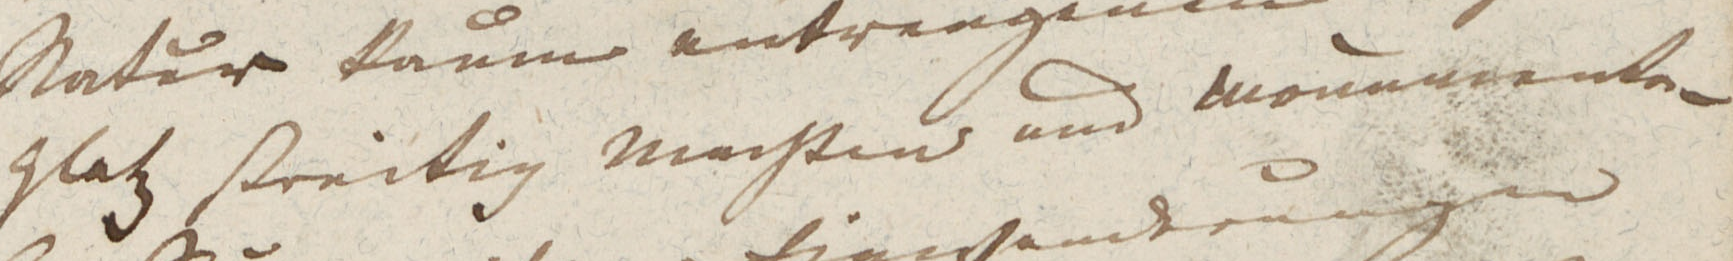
platz streitig machten und monumenta-
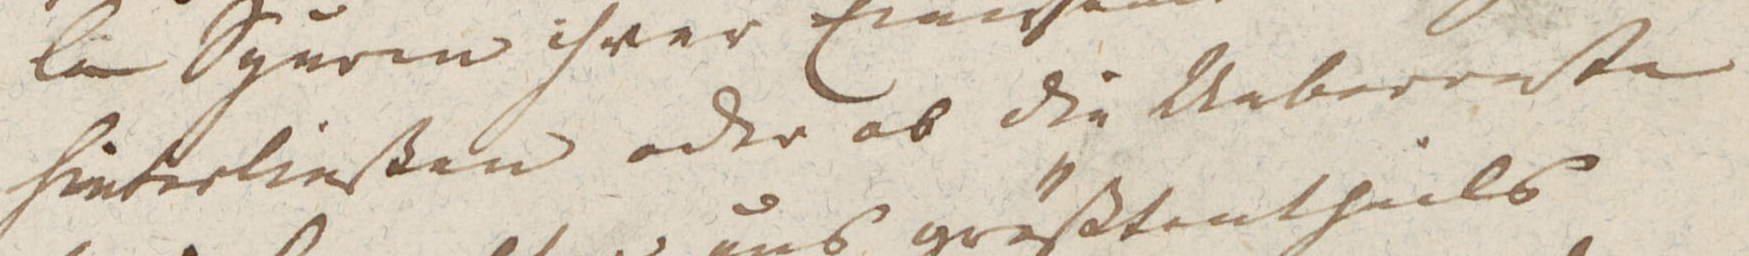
hinterliessen oder ob die Ueberreste
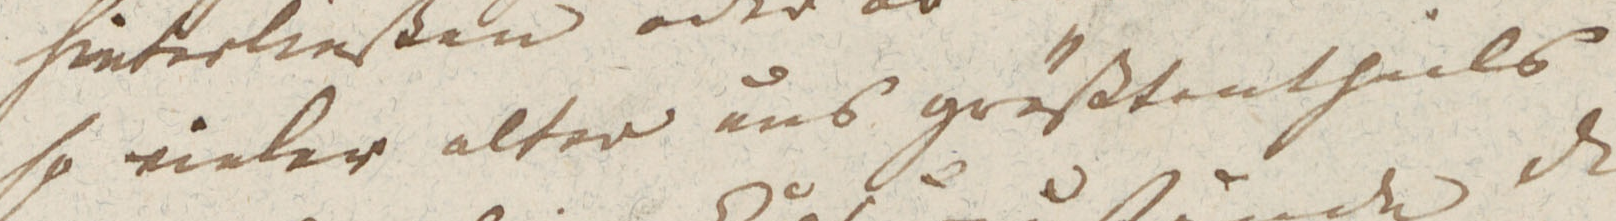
so vieler alter uns grösstentheils
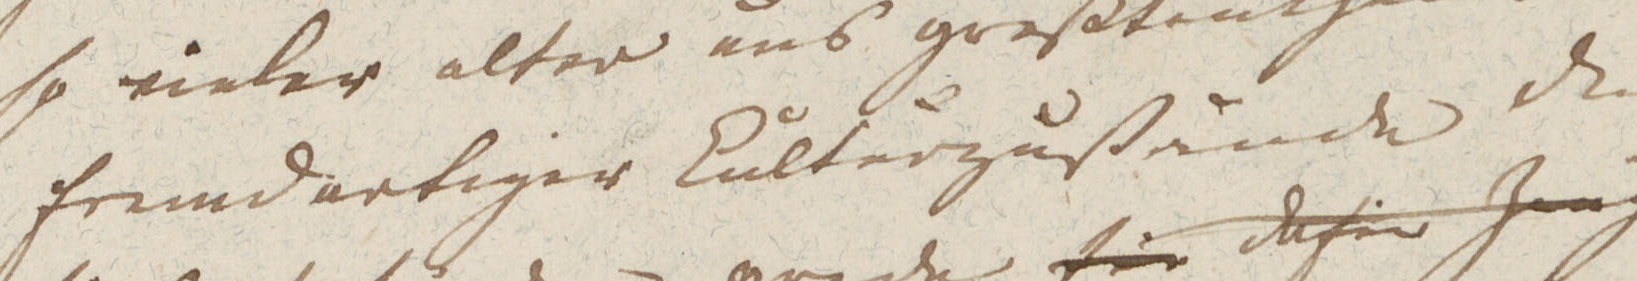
fremdartiger Culturzustände die
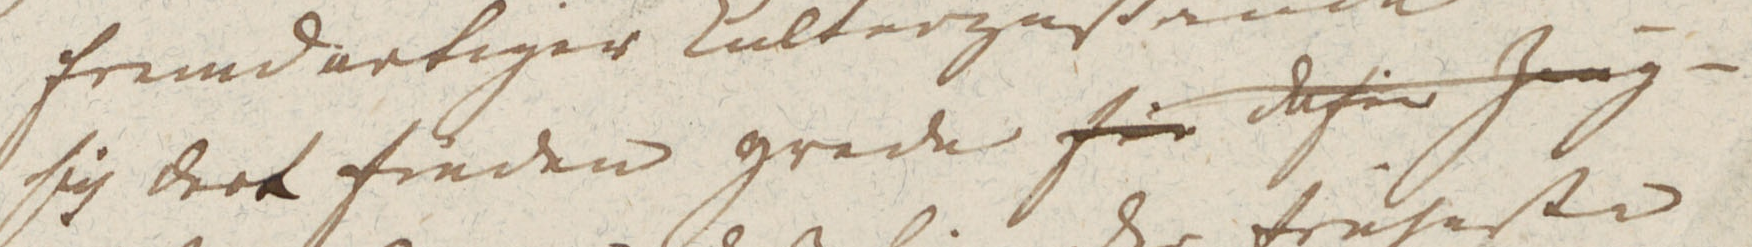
sich dort finden grade für dafür Zeug-
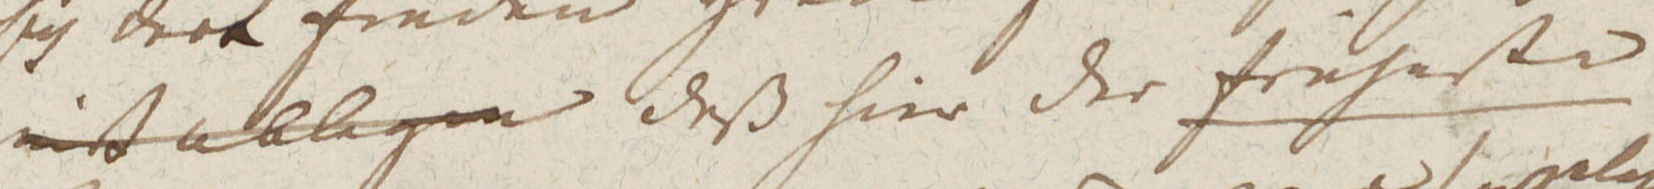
mit ablegen dass hier der früheste
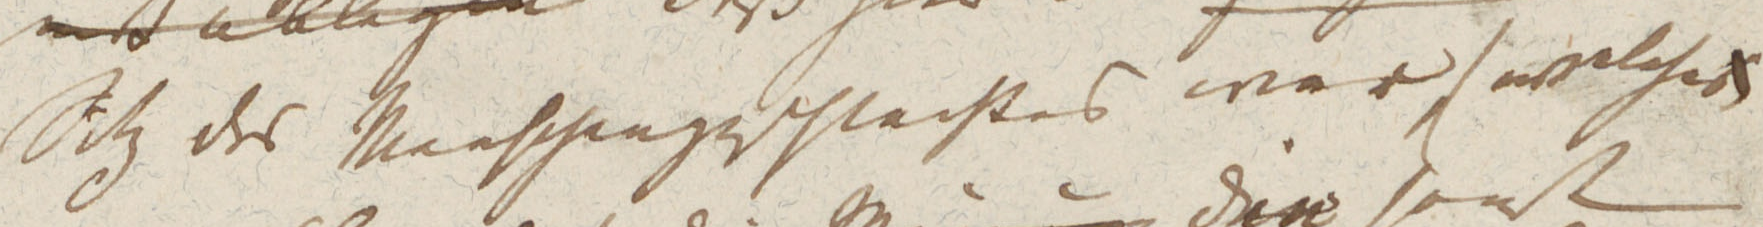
Sitz des Menschengeschlechtes war, (welches
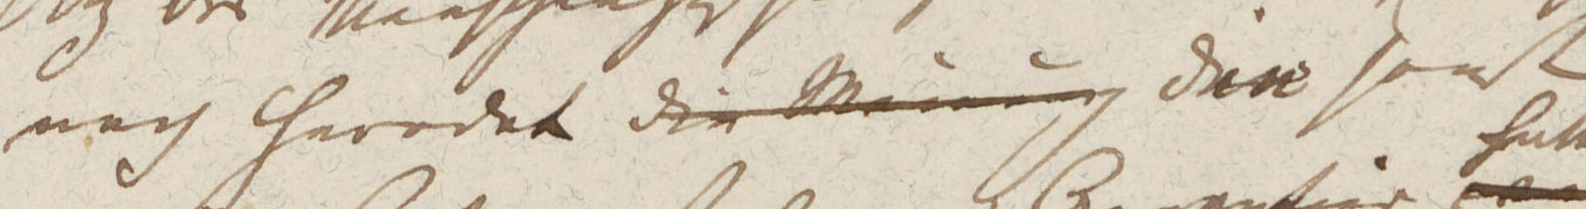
nach Herodot die Meinung derie sonst
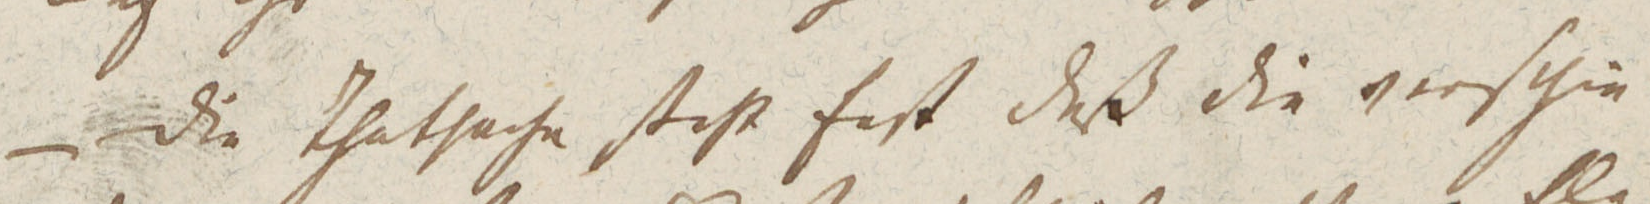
– die Thatsache steht fest dass die verschie-
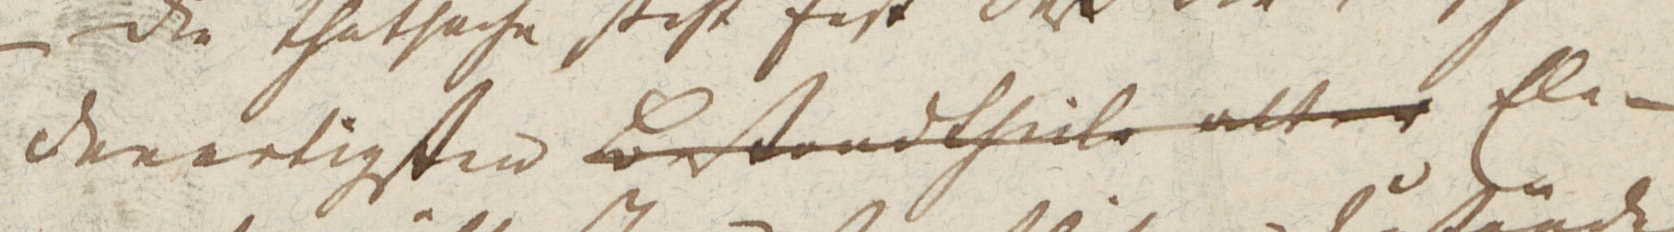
denartigsten Bestandtheile alter Ele-
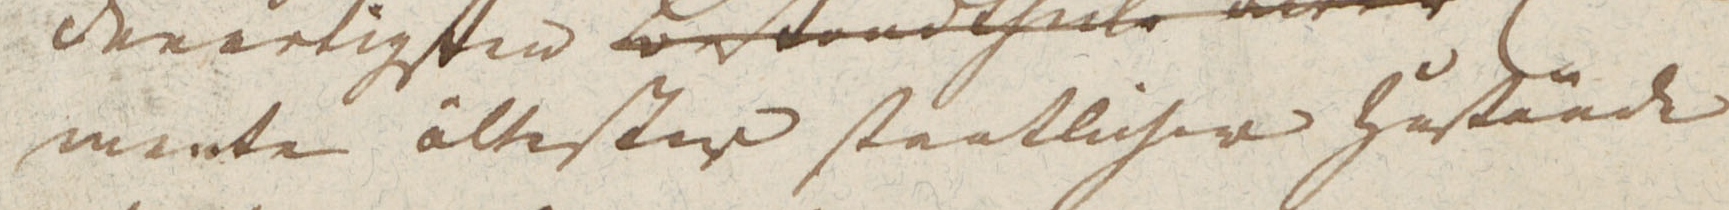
mente ältester staatlicher Zustände
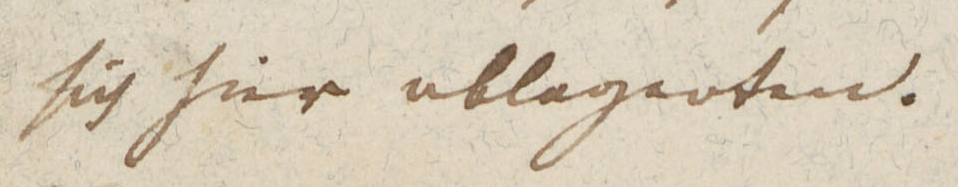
sich hier ablagerten.
